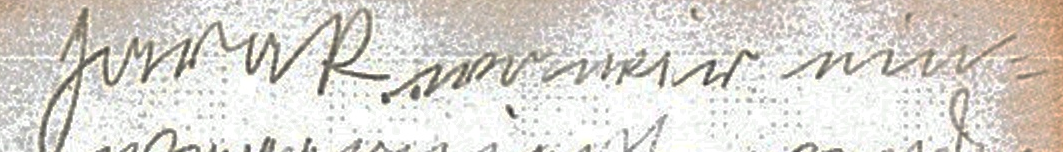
Jarak wo wie ein-
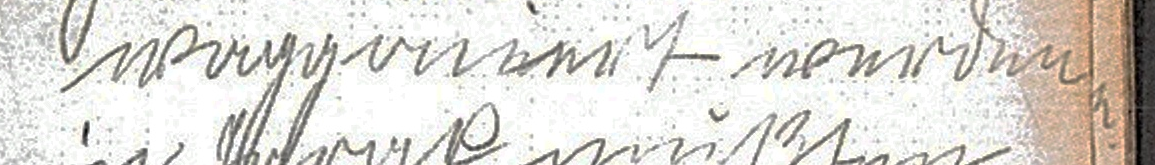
waggoniert wurden
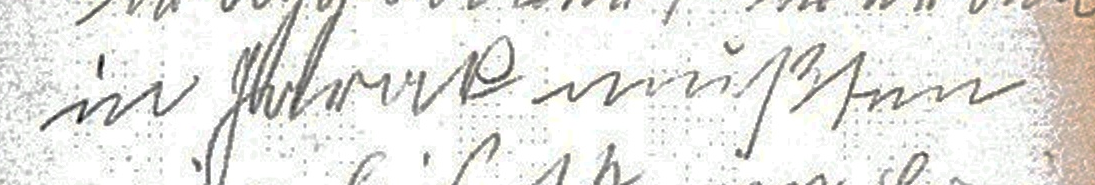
in Jarak mußten
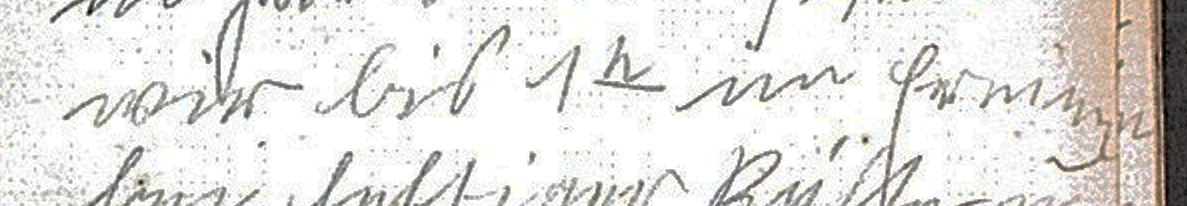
wir bis 1h im freien
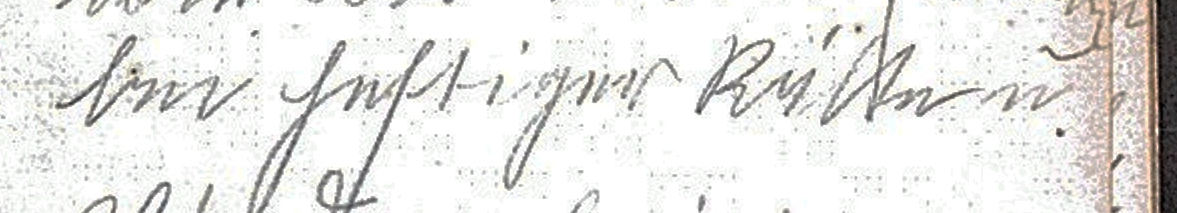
bei heftiger Kälte im
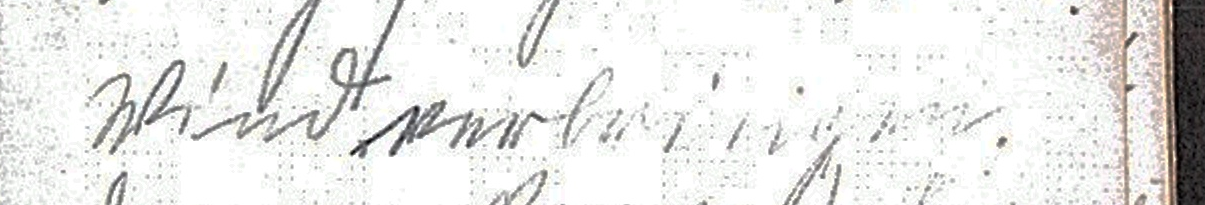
Wind verbringen.
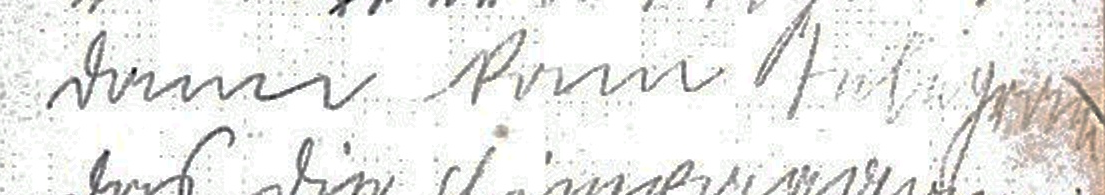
dann kam Telegram
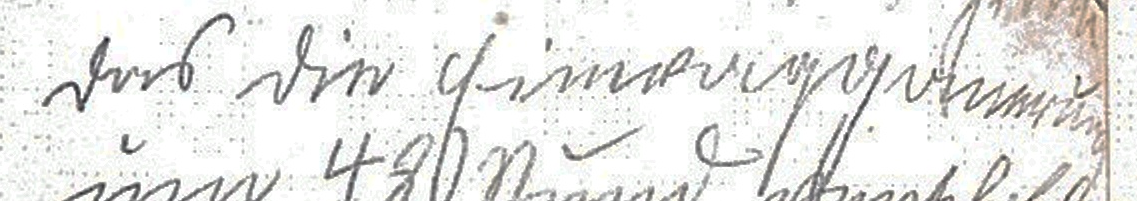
das die Einwaggonierung
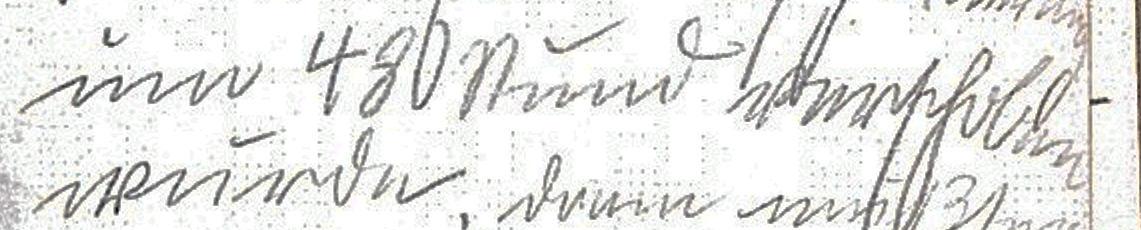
um 48 Stund verschoben
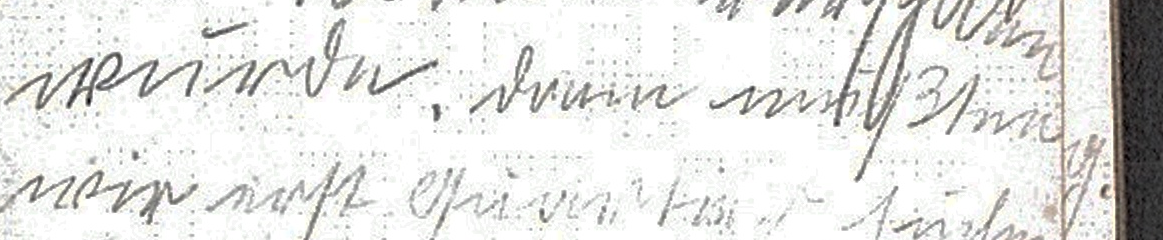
wurde, dann mußten
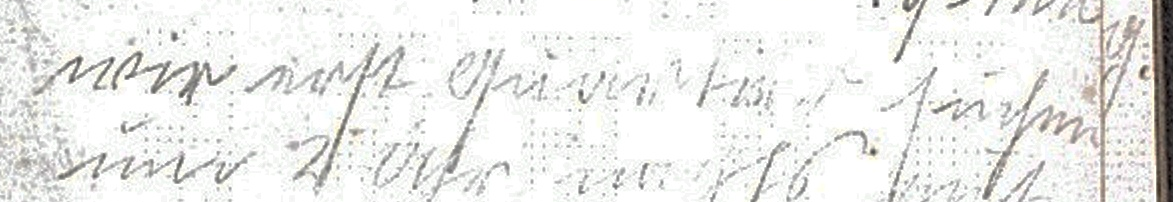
wir erst Quartier suchen
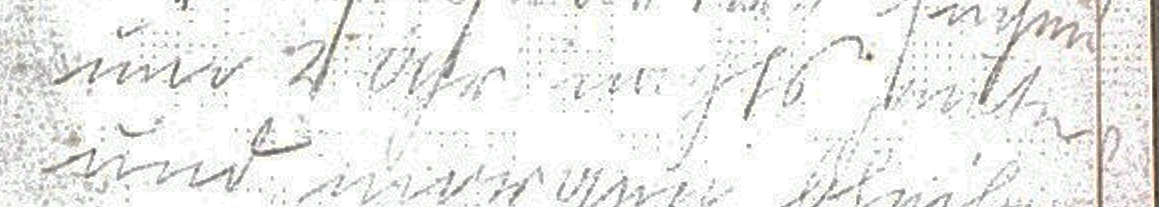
um 4 Uhr nachts heute
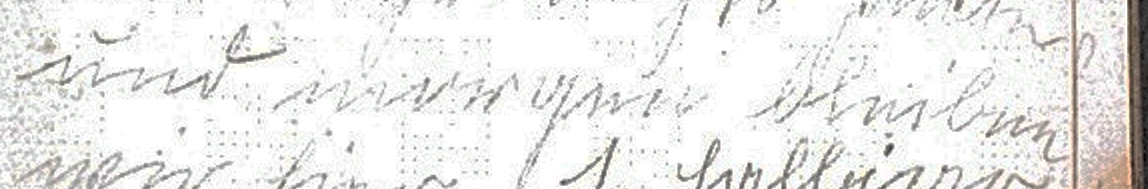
und morgen bleiben
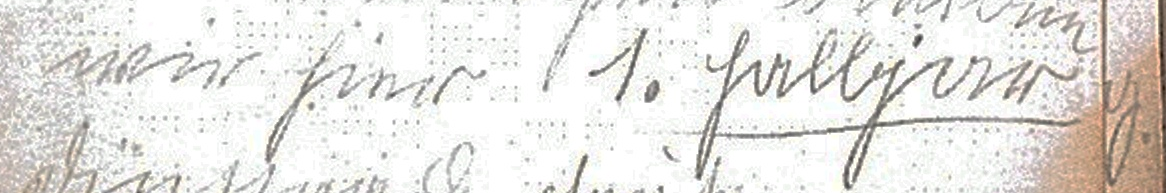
wir hier 1. Halbjahr
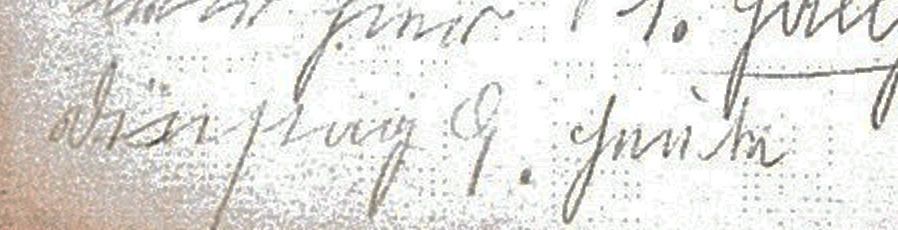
Dienstag 9. Heute
